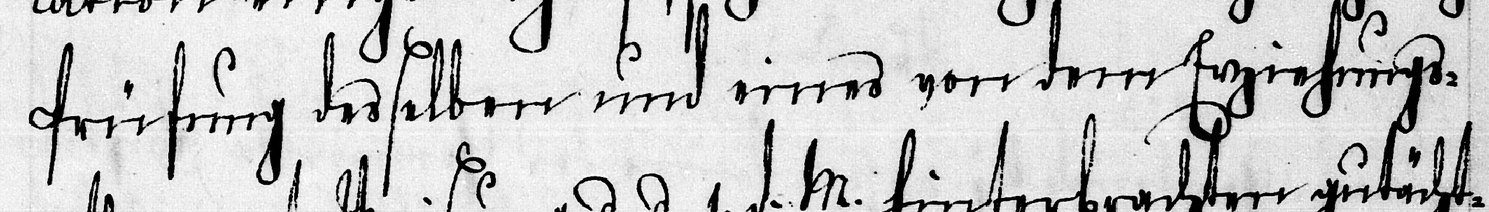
Prüfung desselben und eines von dem Erziehungs¬
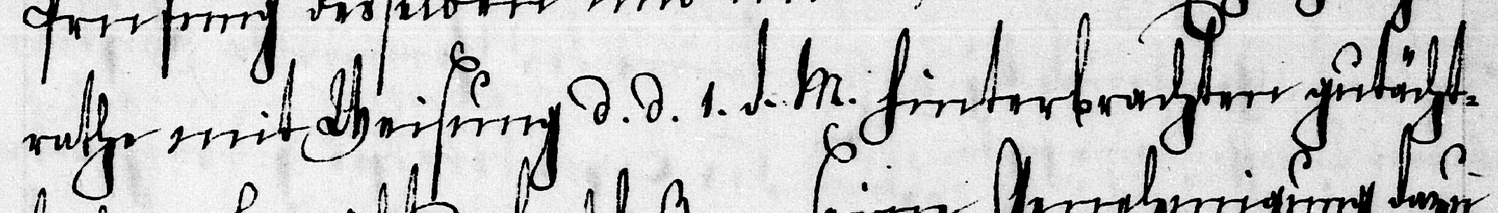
rathe mit Weisung d. d. 1. d. M. hinterbrachten gutächt¬
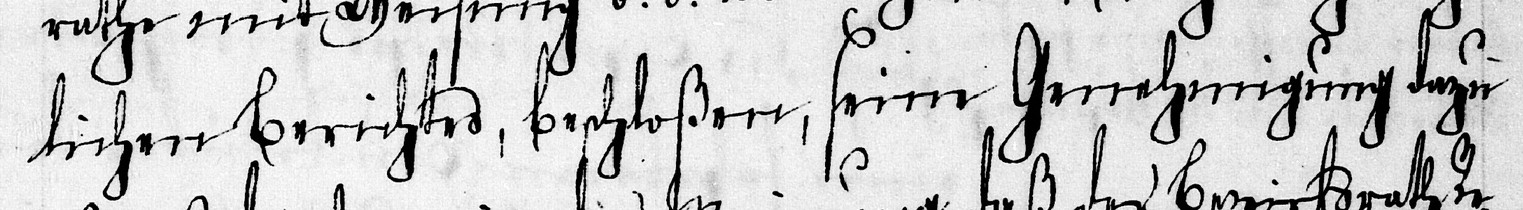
lichen Berichtes, beschloßen, seine Genehmigung dazu
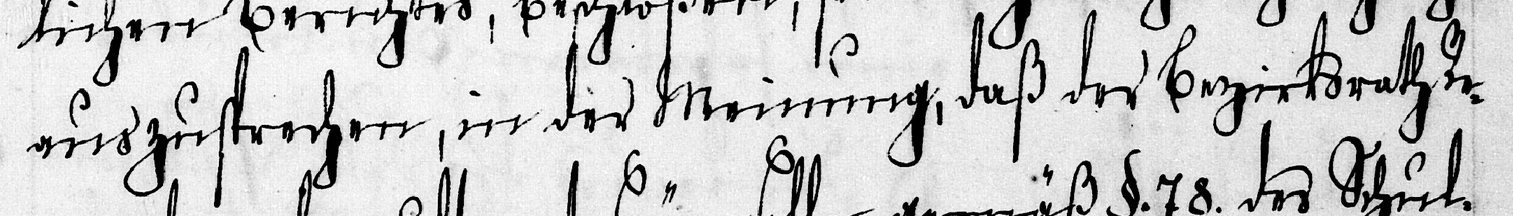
auszusprechen, in der Meinung, daß der Bezirksrath Re¬
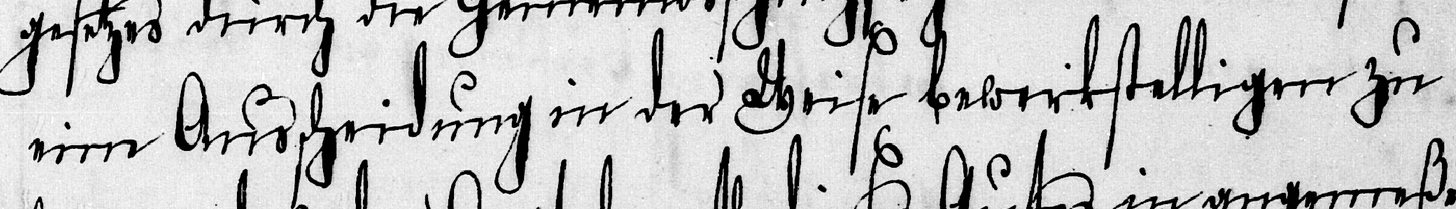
eine Ausscheidung in der Weise bewerkstelligen zu
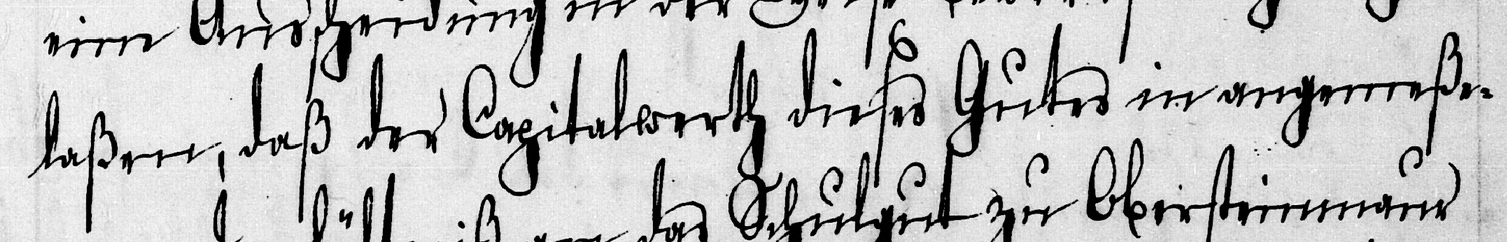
laßen, daß der Capitalwerth dieses Gutes in angemeß¬
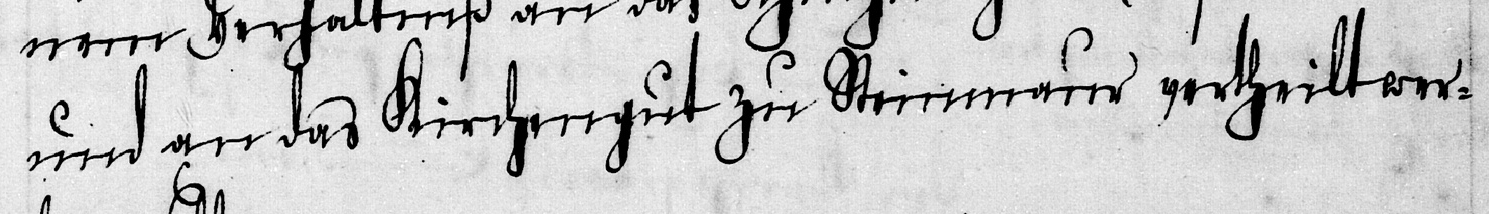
und an das Kirchengut zu Steinmaur vertheilt wer¬
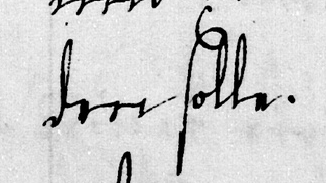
den solle.
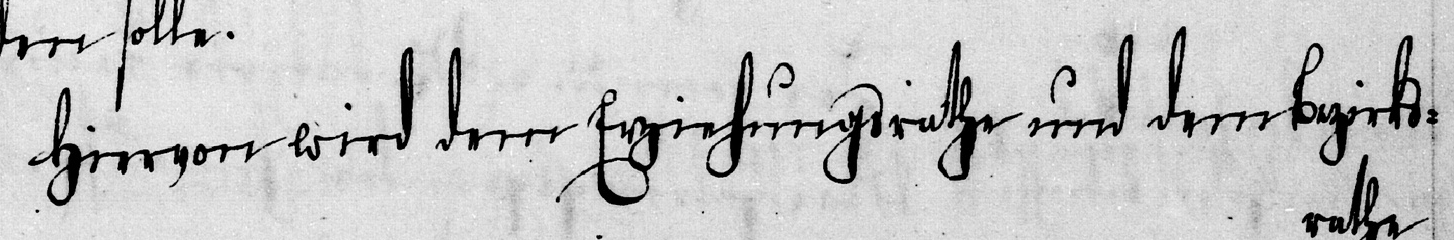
Hiervon wird dem Erziehungsrathe und dem Bezirks-
